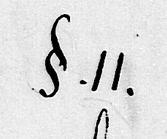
§. 11.
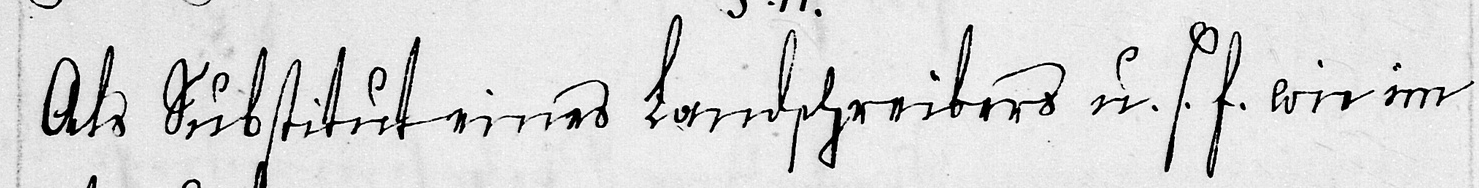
Als Substitut eines Landschreibers u. s. f. wie im
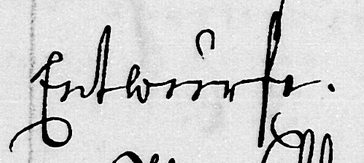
Entwurfe.
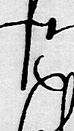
1.)
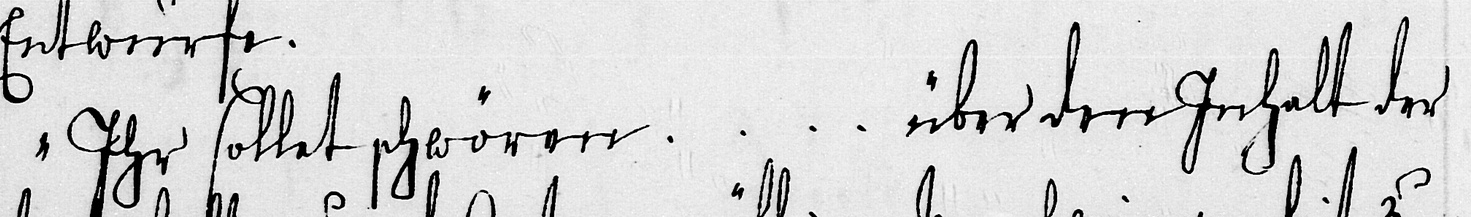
„Ihr sollet schwören … über den Inhalt der
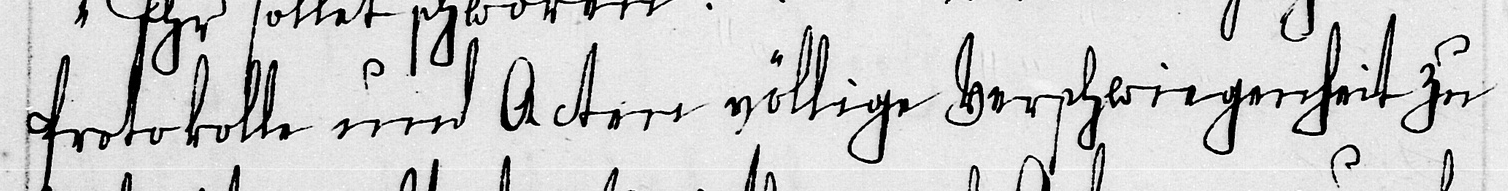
Protokolle und Acten völlige Verschwiegenheit zu
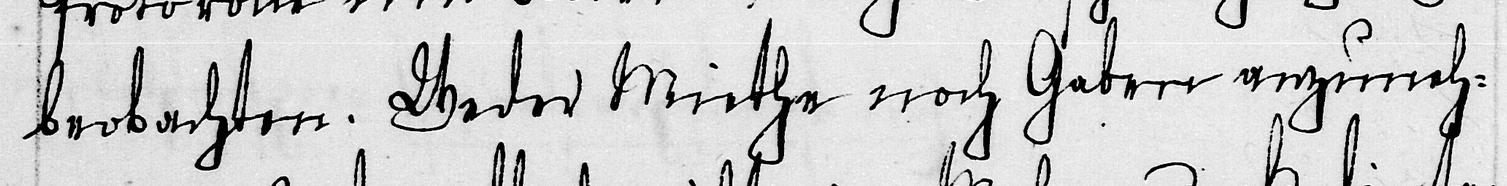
beobachten. Weder Miethe noch Gaben anzuneh¬
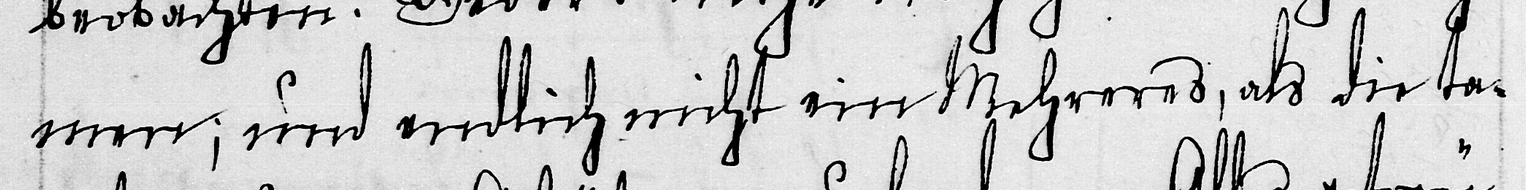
men; und endlich nicht ein Mehreres, als die ta¬
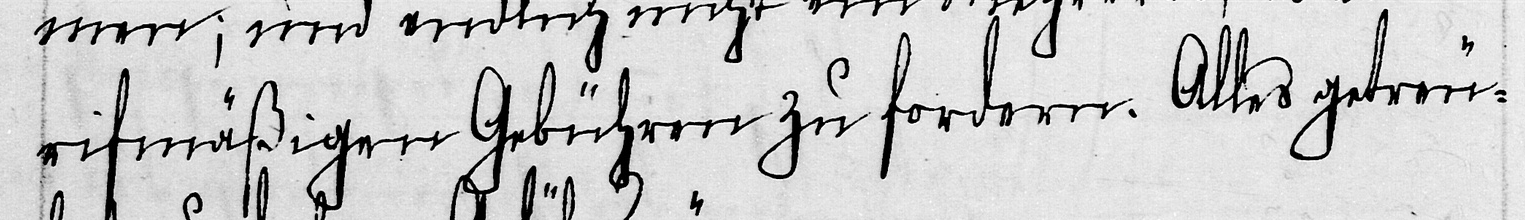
rifmäßigen Gebühren zu fordern. Alles getreu¬
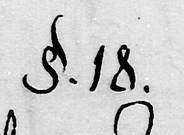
§. 18.
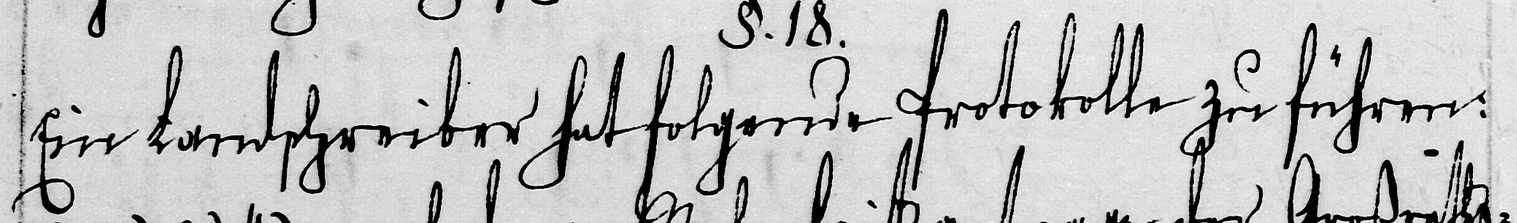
Ein Landschreiber hat folgende Protokolle zu führen:
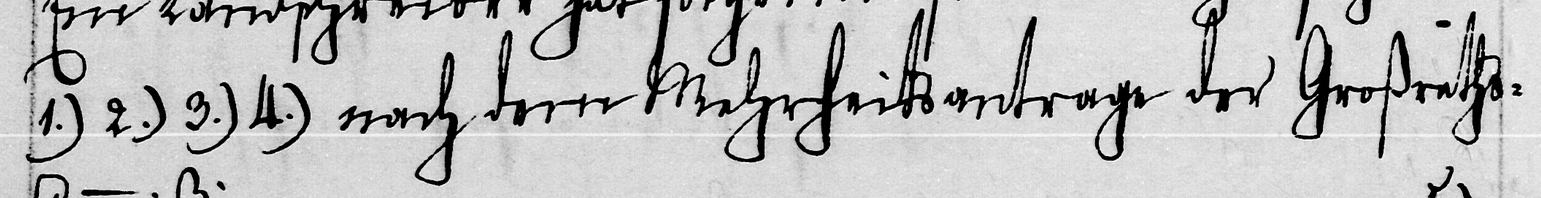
2.) 3.) 4.) nach dem Mehrheitsantrage der Großrath¬
